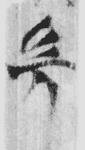𡵂
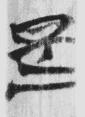是
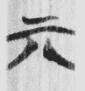亓
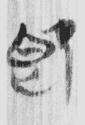即
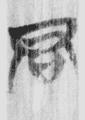君
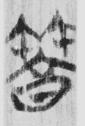{竹亯}
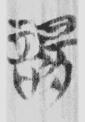諹
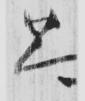也
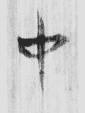中
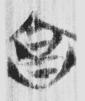合
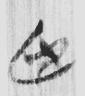臣
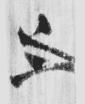之
